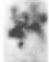牧
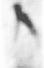人
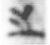之
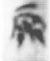兩
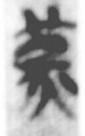黃
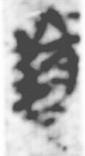韒
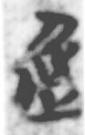○（路）
